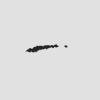一
